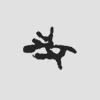寺
